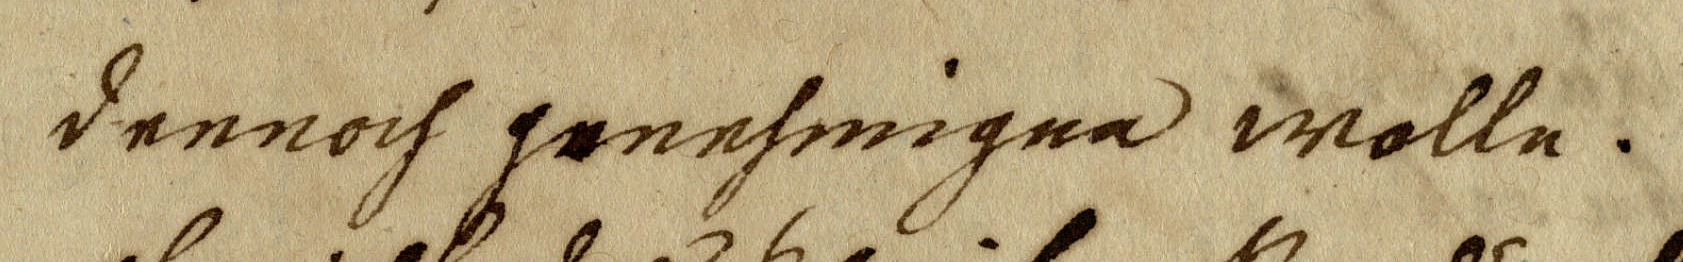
dennoch genehmigen wolle.
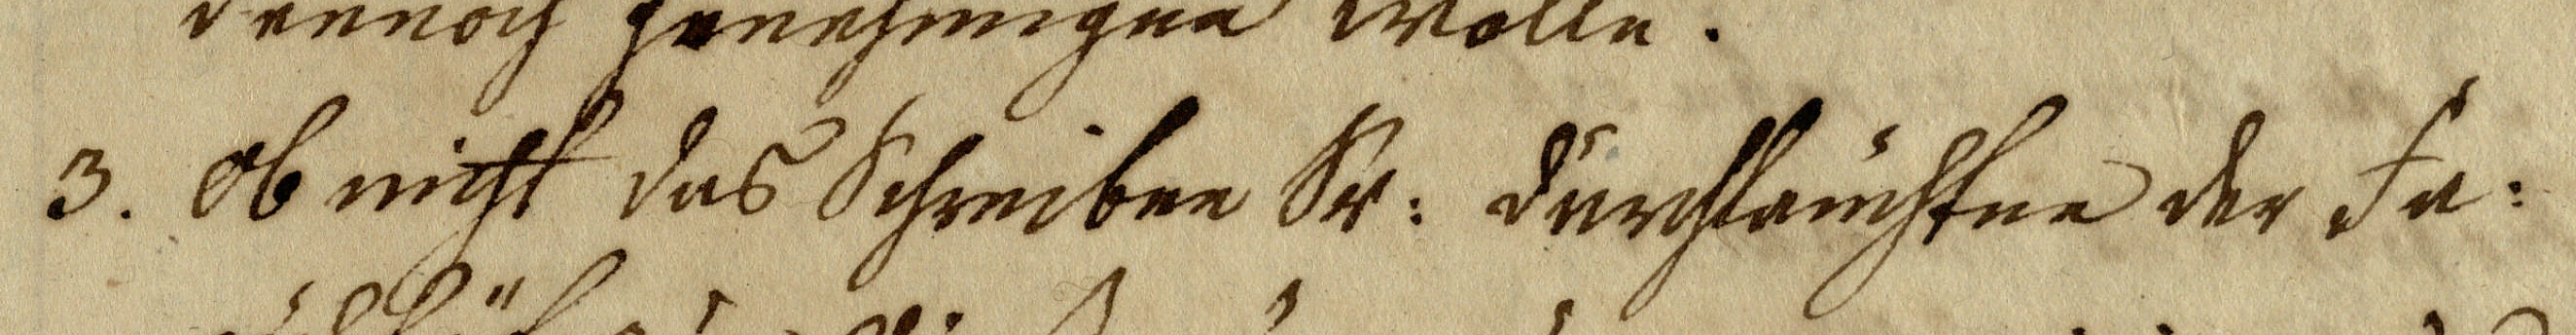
3. ob nicht das Schreiben Sr. Durchlauchten der Fa¬
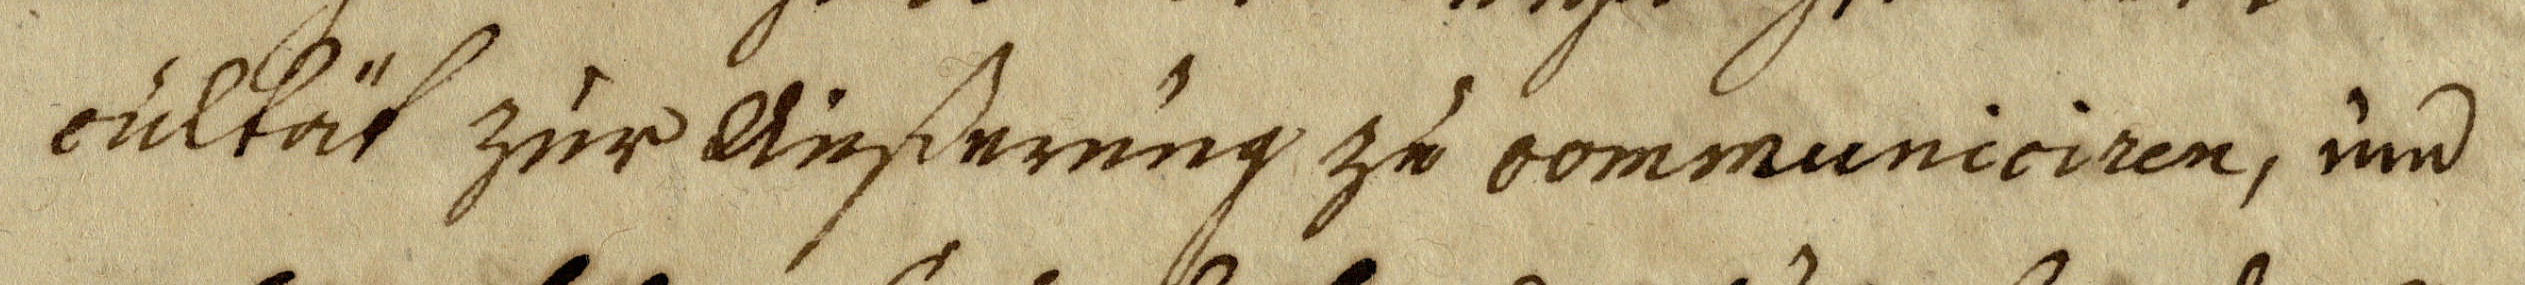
cultät zur Äußerung zu communiciren, und
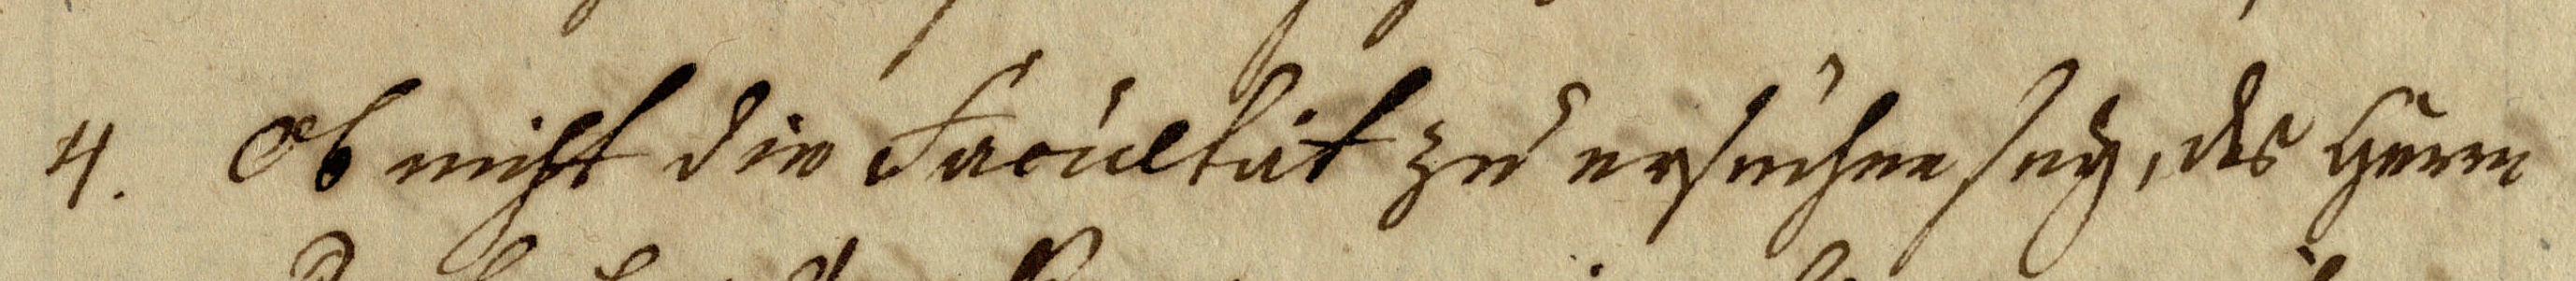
4. ob nicht die Facultät zu ersuchen seÿ, des Herrn
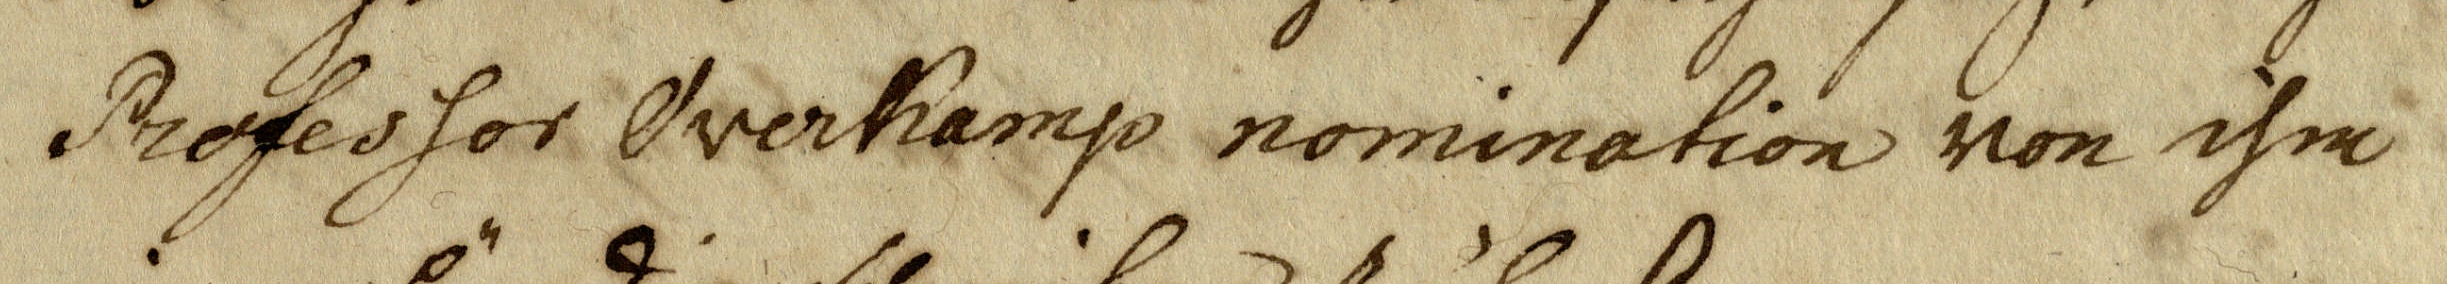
Professor Overkamp nomination von ihm
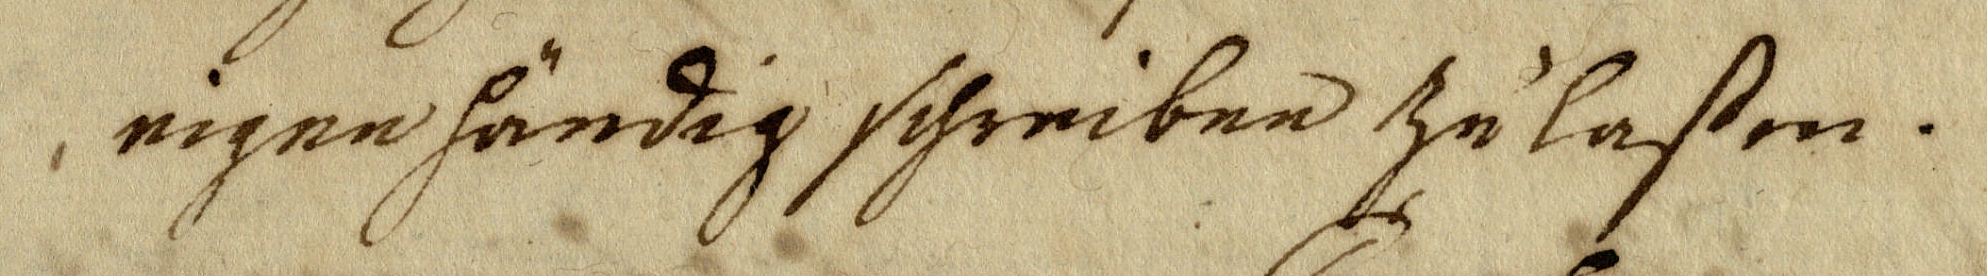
eigen händig schreiben zu laßen.
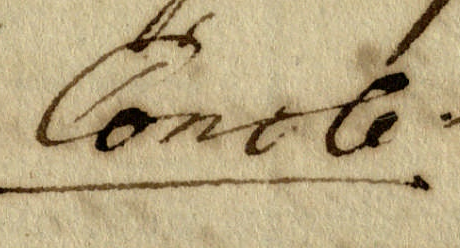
Concl.
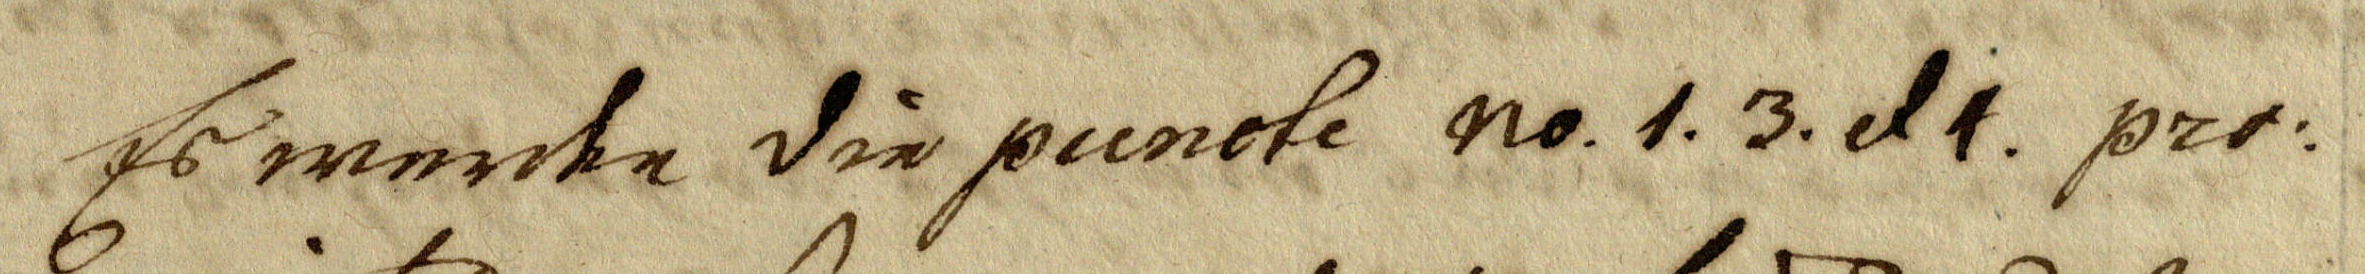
Es werden die puncte no. 1. 3. et 4. pro¬
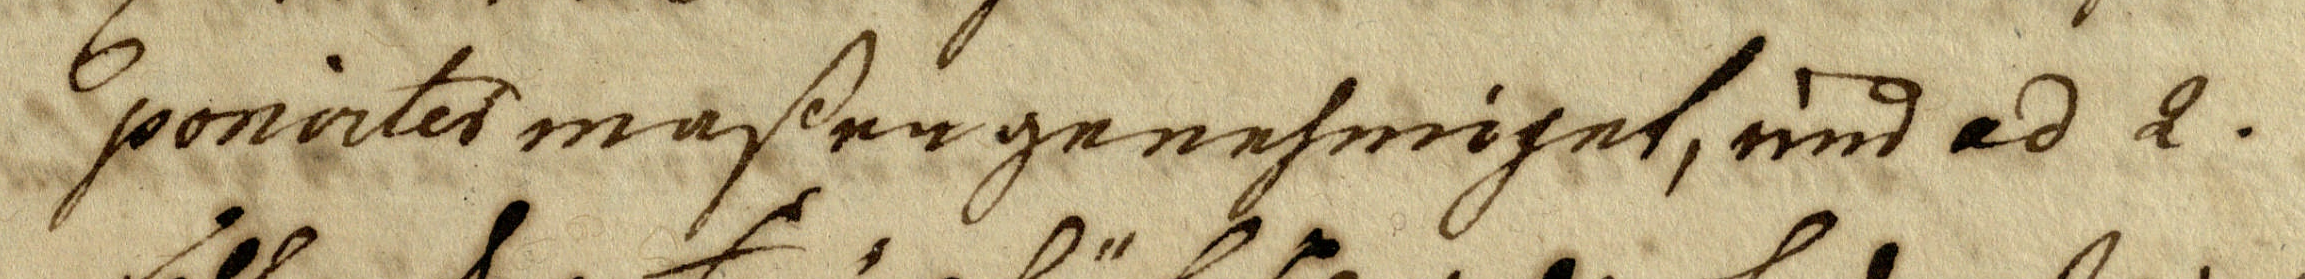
ponirter maßen genehmiget, und ad 2.
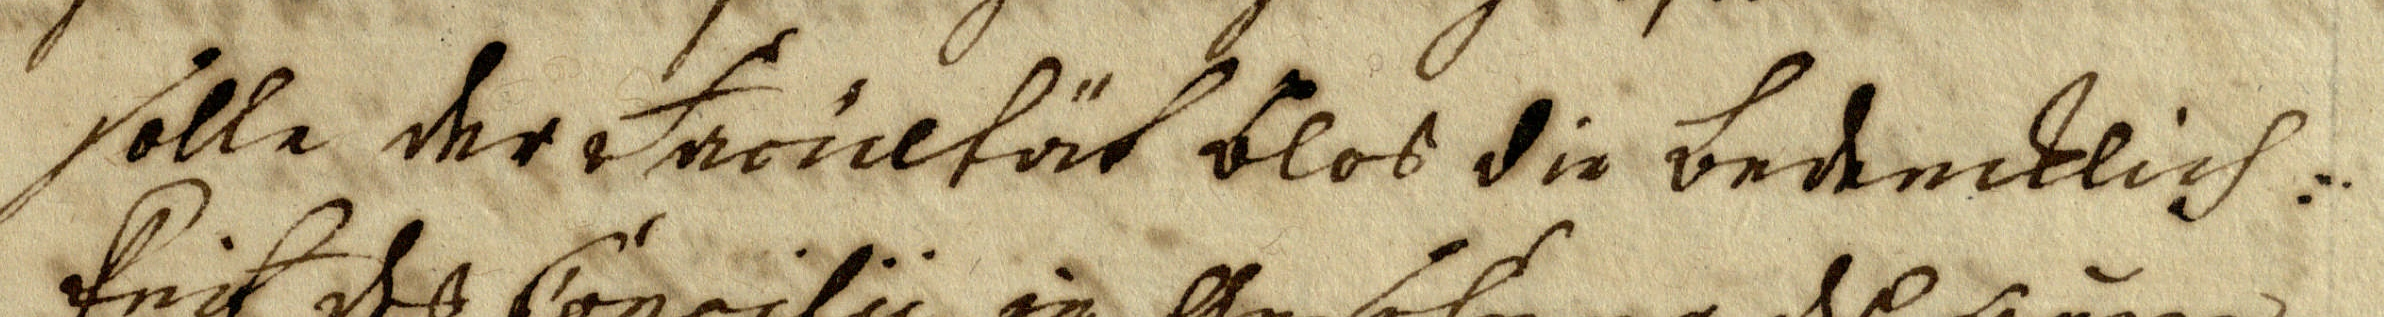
solle der Facultät blos die Bedenklich¬
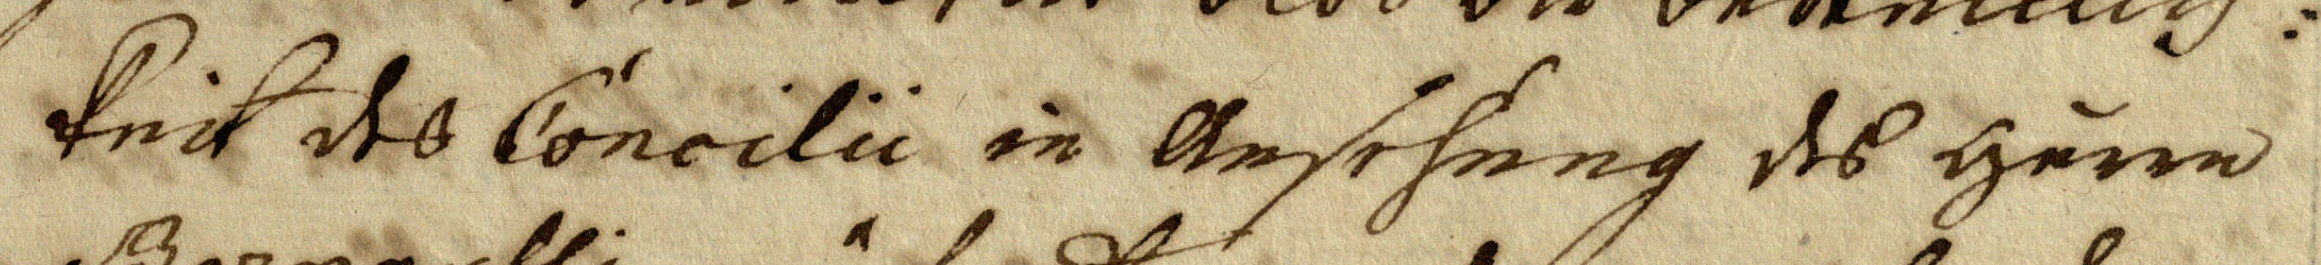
keit des Concilii in Ansehung des Herrn
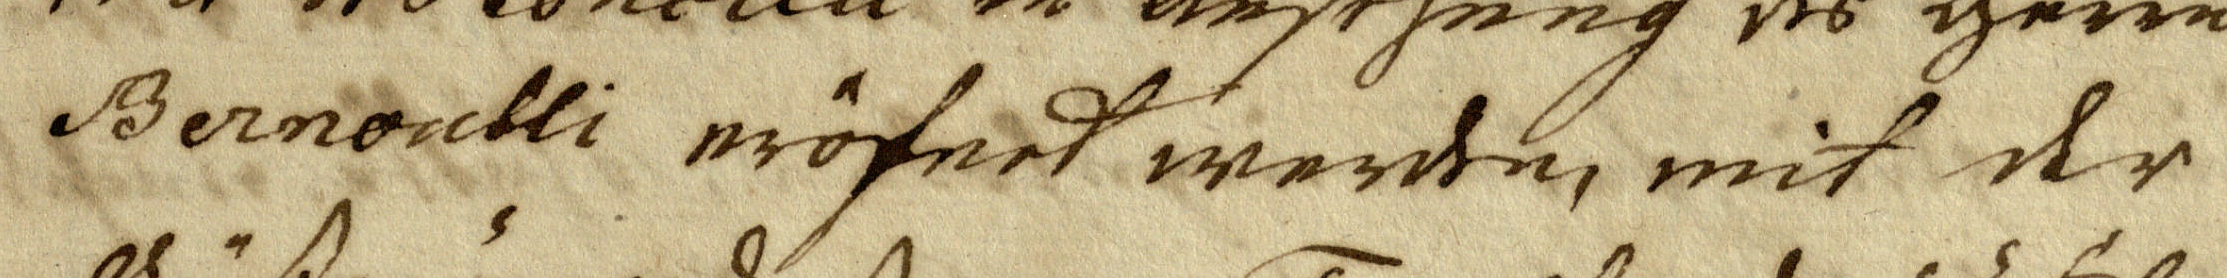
Bernoulli eröfnet werden, mit der
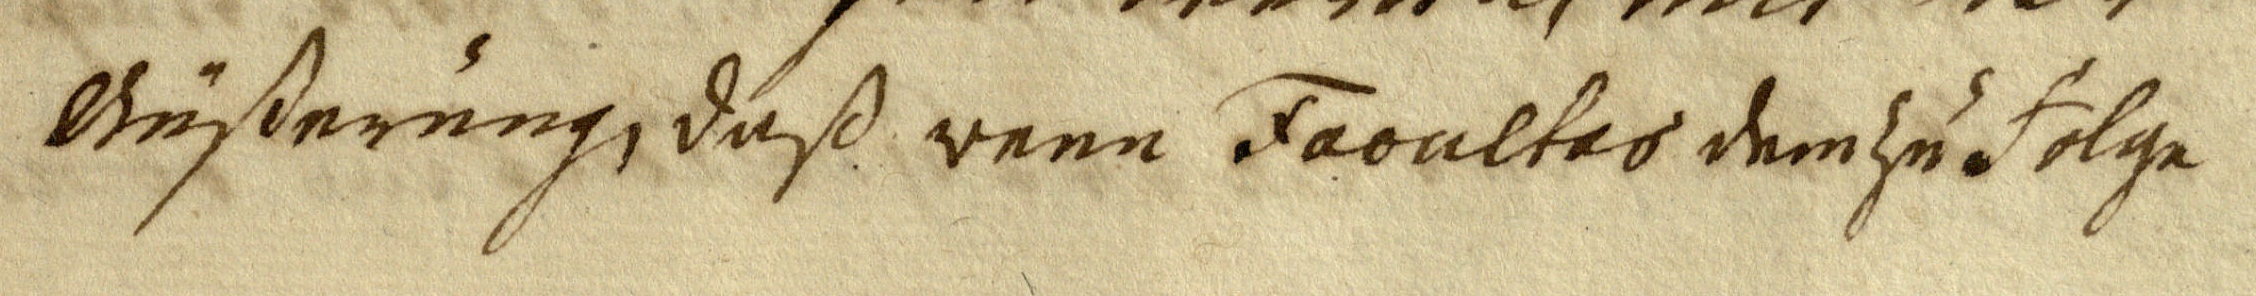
Äußerung, daß wenn Facultas dem zu Folge
